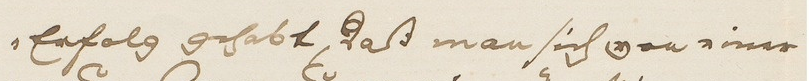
Erfolg gehabt, daß man sich von einer
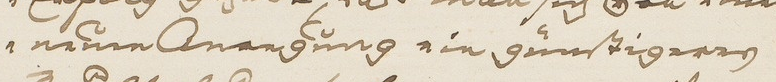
neuen Anregung ein günstigeres
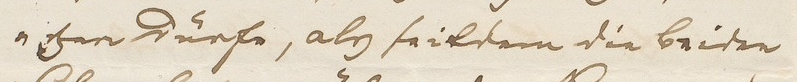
chen dürfe, als seitdem die beiden
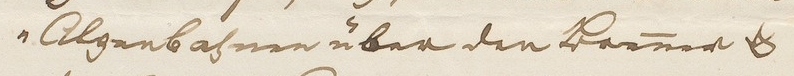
Alpenbahnen über den Brenner &
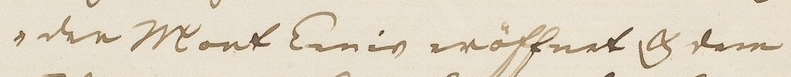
den Mont Cenis eröffnet & dem
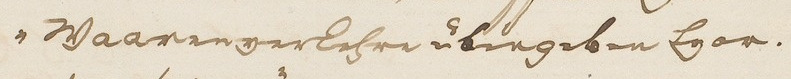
Waarenverkehre übergeben wor-
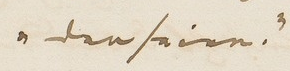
den seien.»
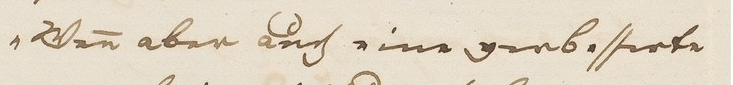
«Wenn aber auch eine verbesserte
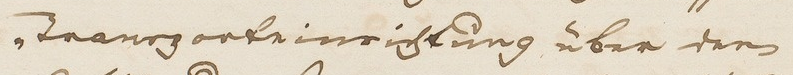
Transporteinrichtung über den
